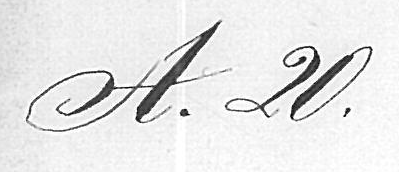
A. 20.
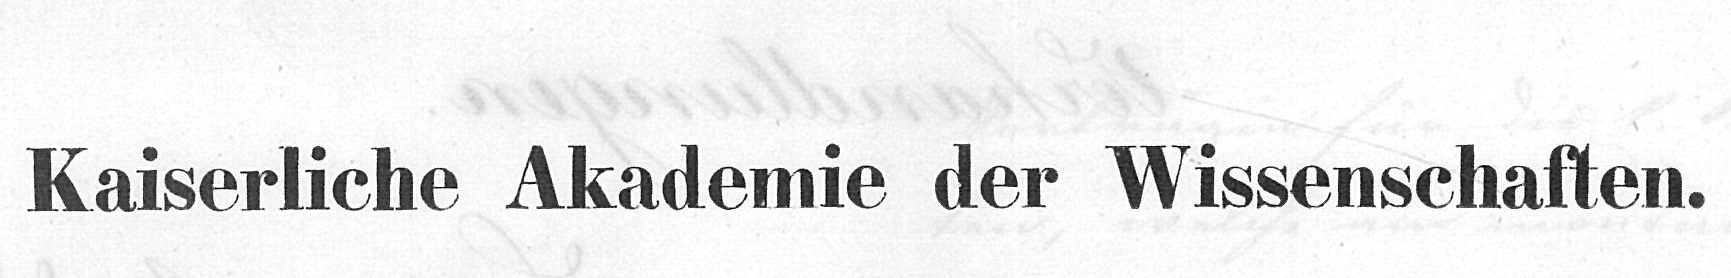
Kaiserliche Akademie der Wissenschaften.
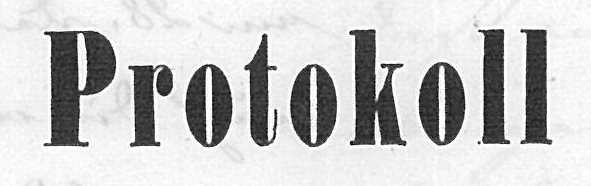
Protokoll
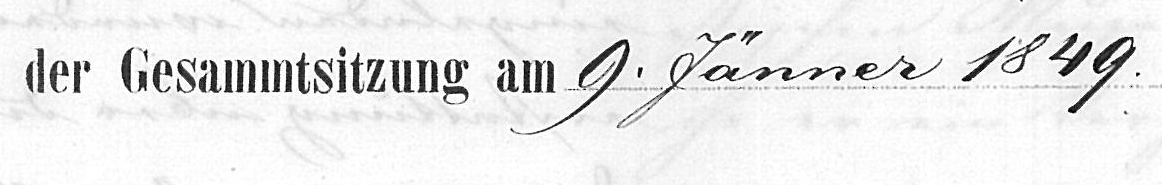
der Gesammtsitzung am 9. Jänner 1849
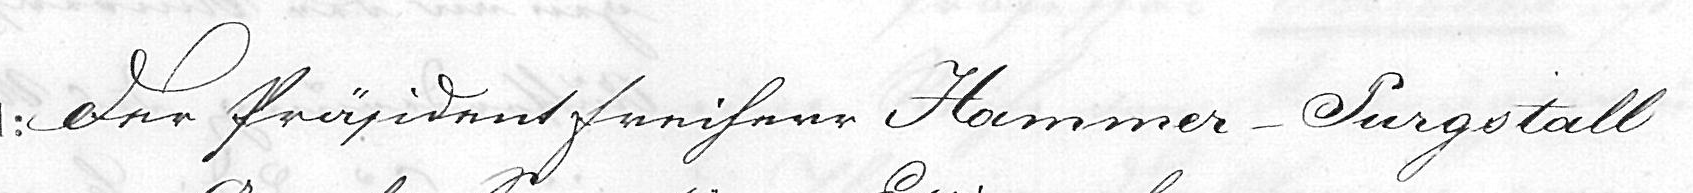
Der Präsident Freiherr Hammer-Purgstall
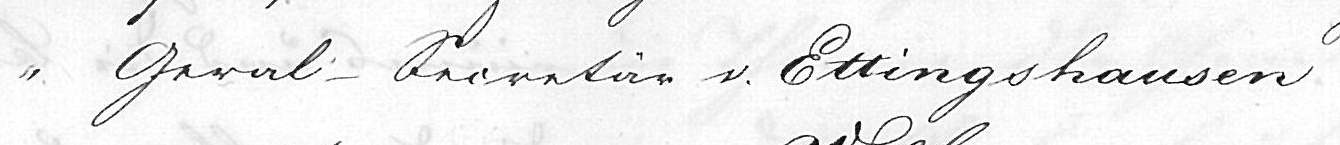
" Geral-Secretär v. Ettingshausen
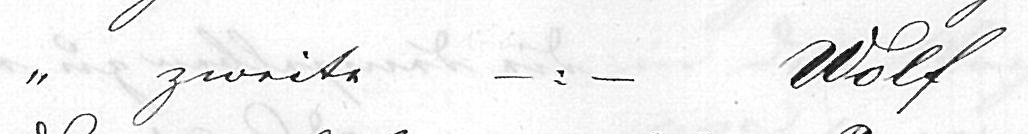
" zweite " Wolf
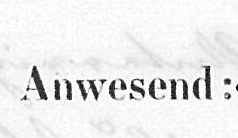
Anwesend:
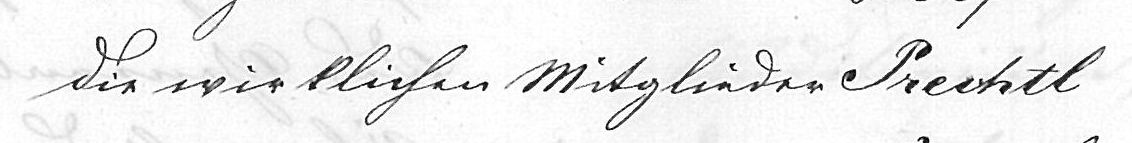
die wirklichen Mitglieder Prechtl
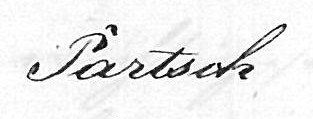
Partsch
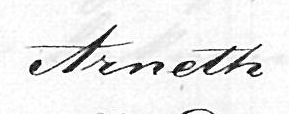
Arneth
